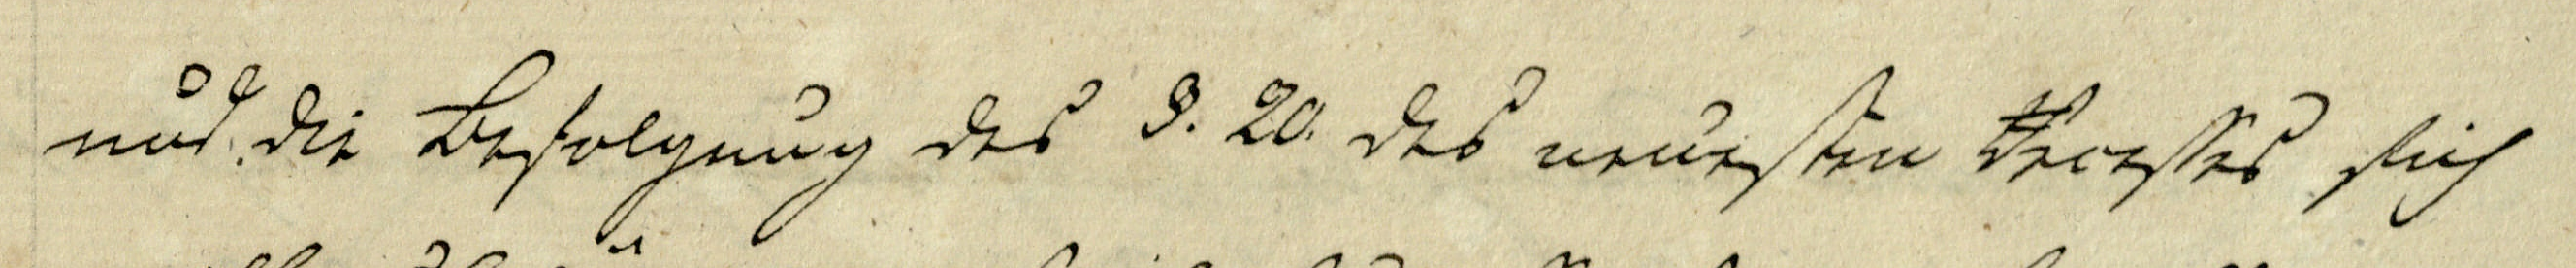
und die Befolgung des §. 20 des neuesten Recesses sich
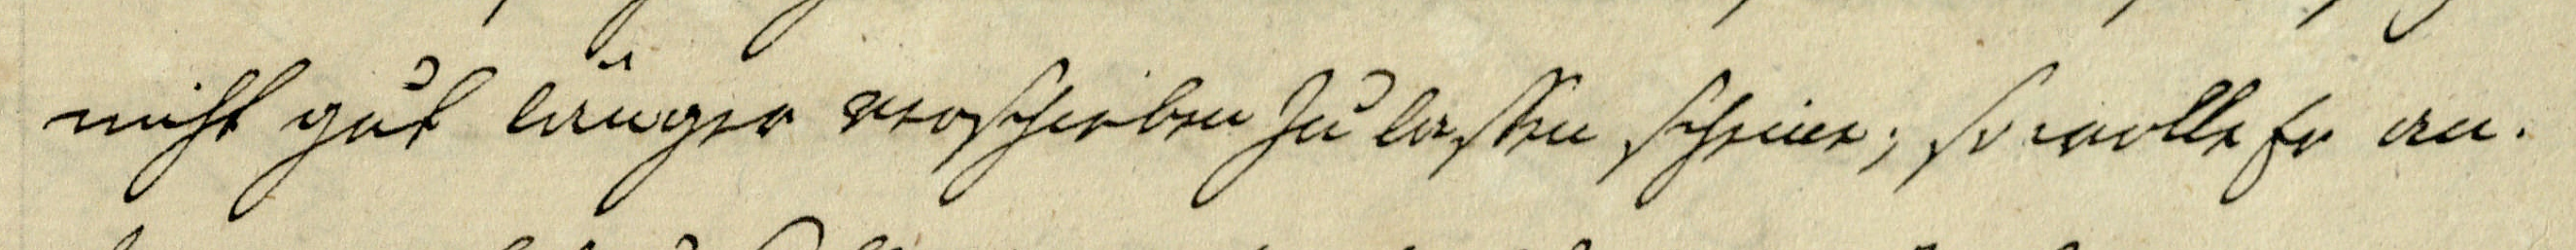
nicht gut länger verschieben zu lassen scheine; so wolle Er an¬
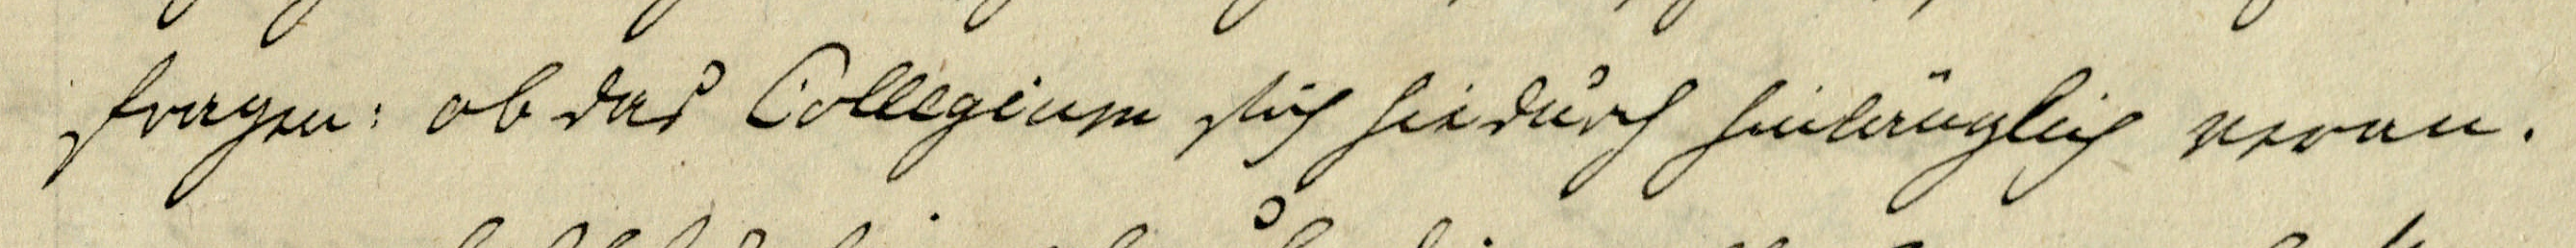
fragen: ob das Collegium sich hiedurch hinlänglich veran¬
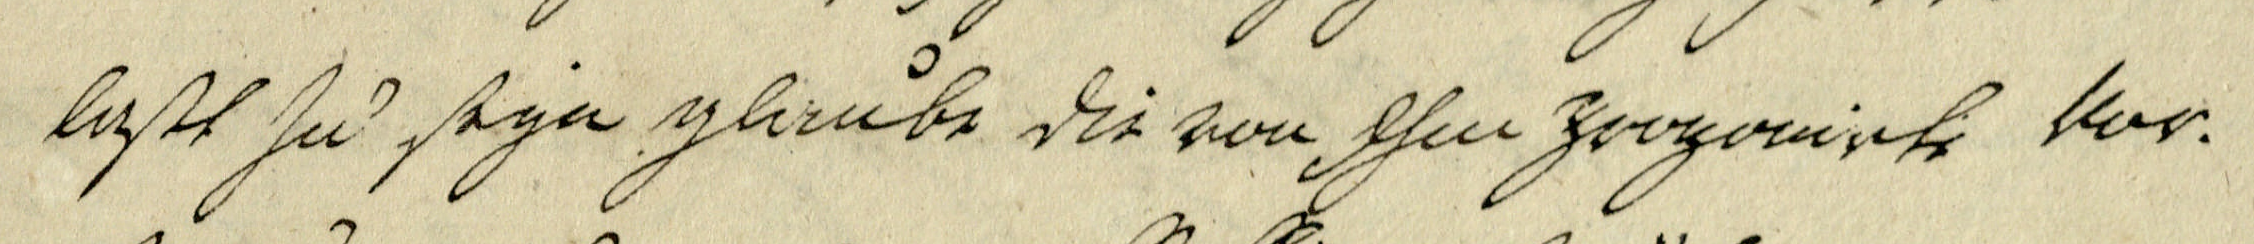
laßt zu seÿn glaube die von Ihm proponirte Vor¬
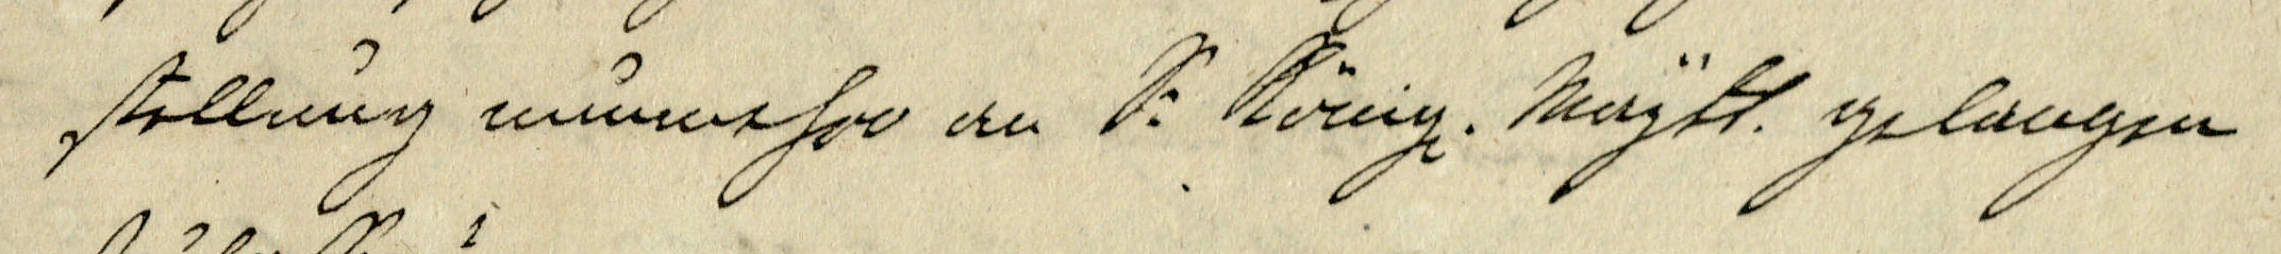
stellung nunmehro an Sr. König. Maÿtt. gelangen
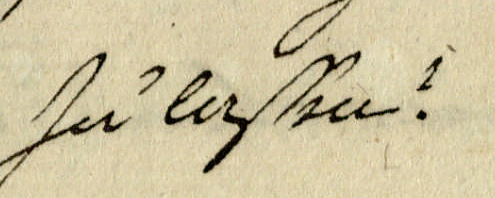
zu lassen?
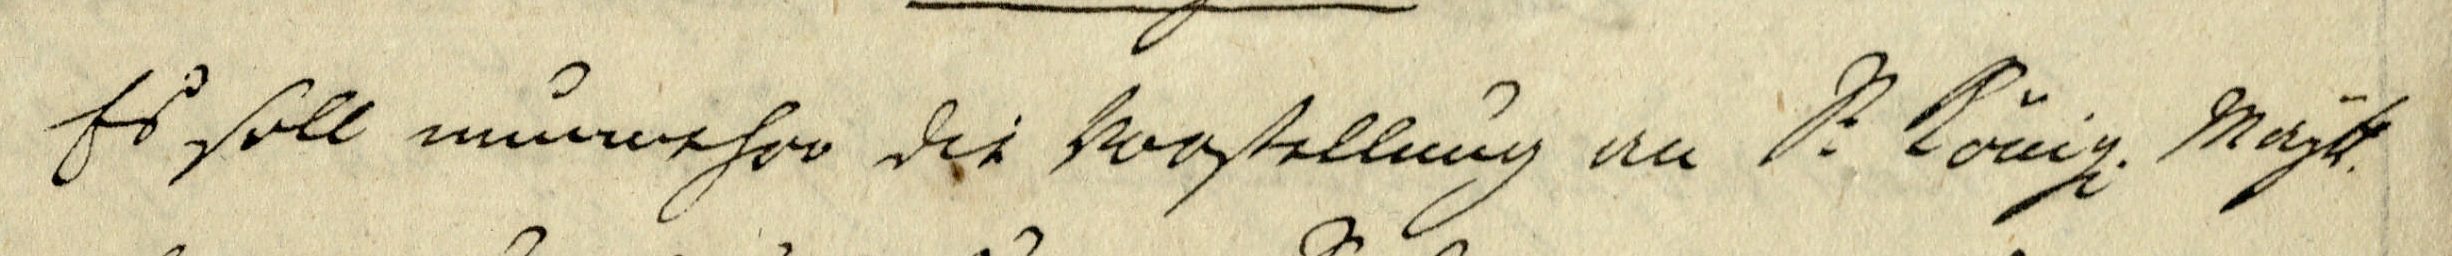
Es soll nunmehro die Vorstellung an Sr König. Maÿtt.
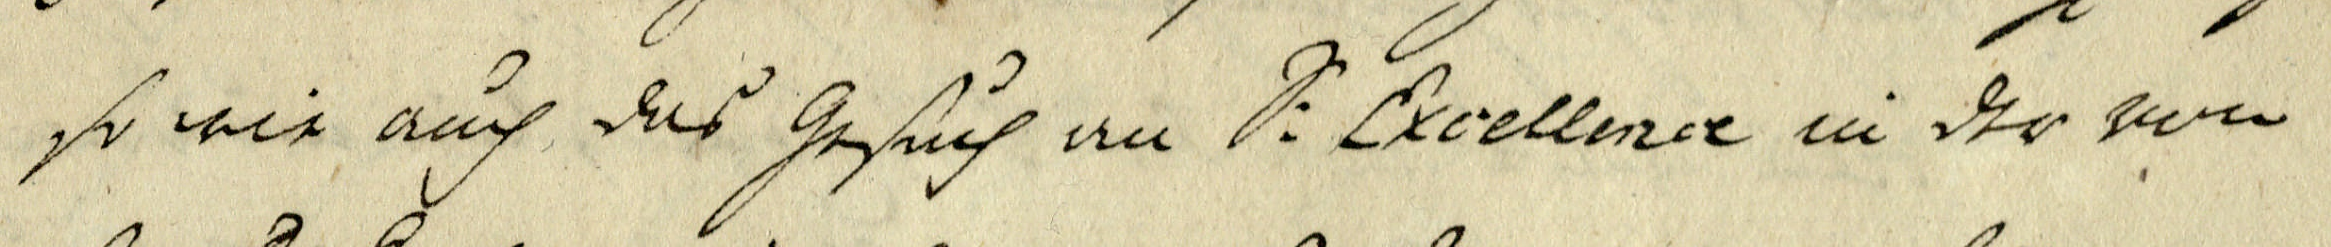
so wie auch das Gesuch an Sr Excellence in der von
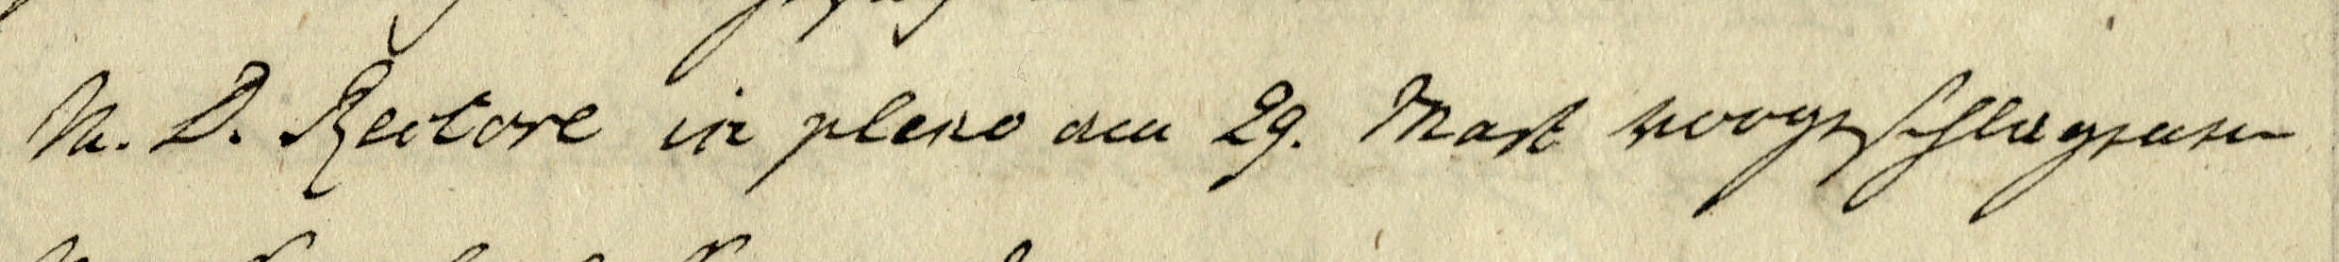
M. D. Rectore in pleno am 29. Mart vorgeschlagenen
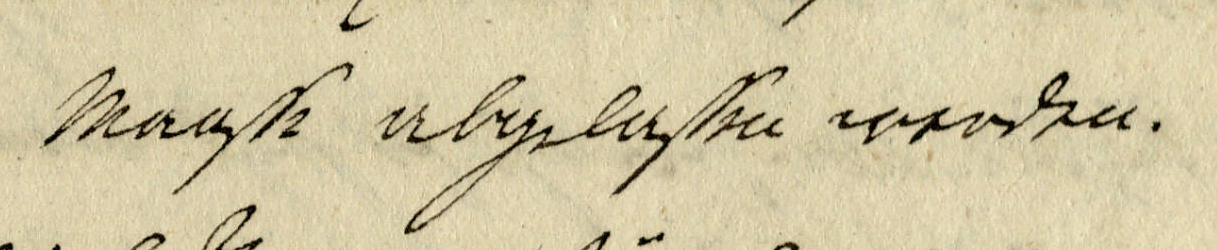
Maasse abgelassen werden.
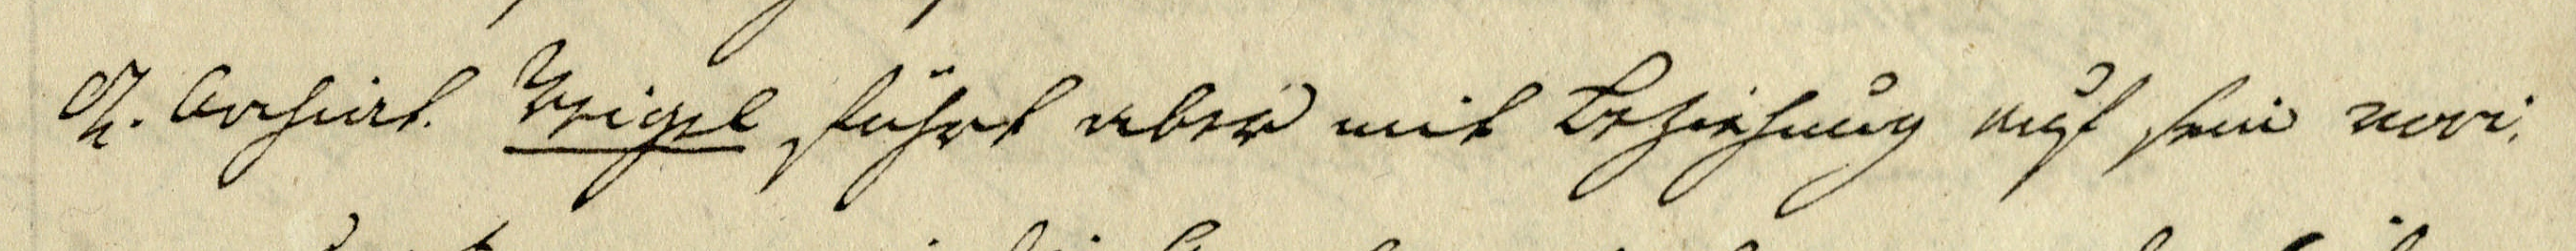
dh. Archiat Weigel führt aber mit Beziehung auf sein vori¬
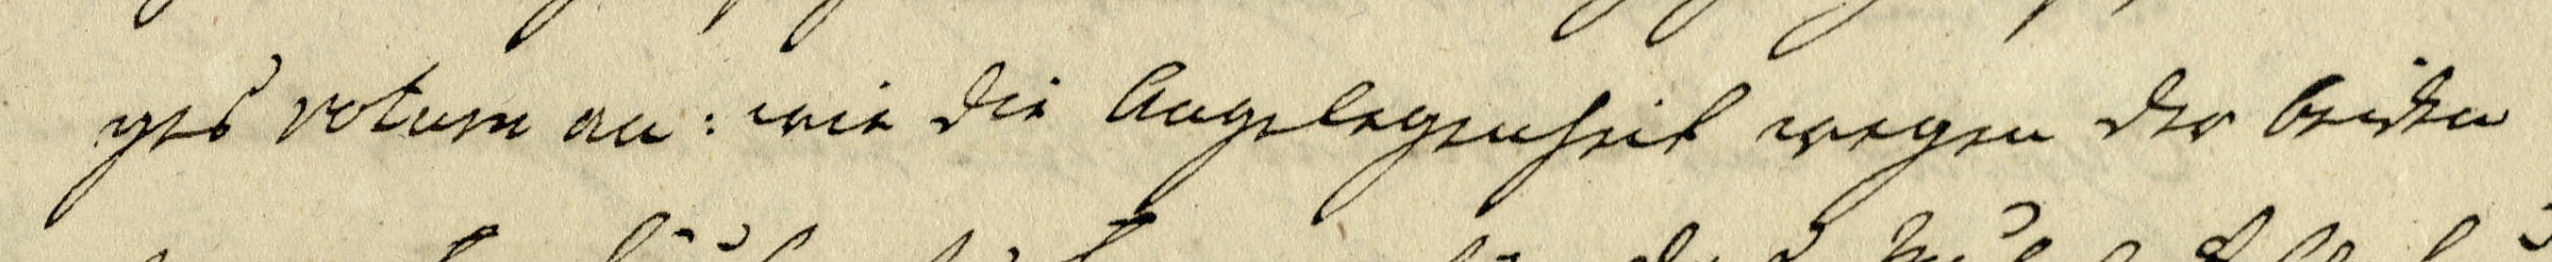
ges votum an: wie die Angelegenheit wegen der beiden
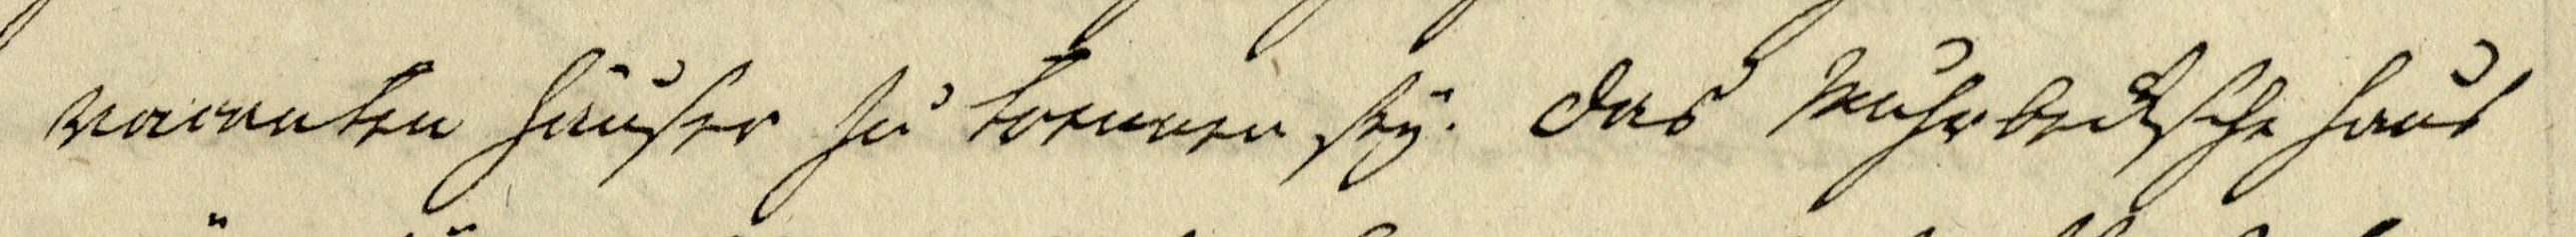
vacanten Häuser zu trennen seÿ. Das Muhrbecksche Haus
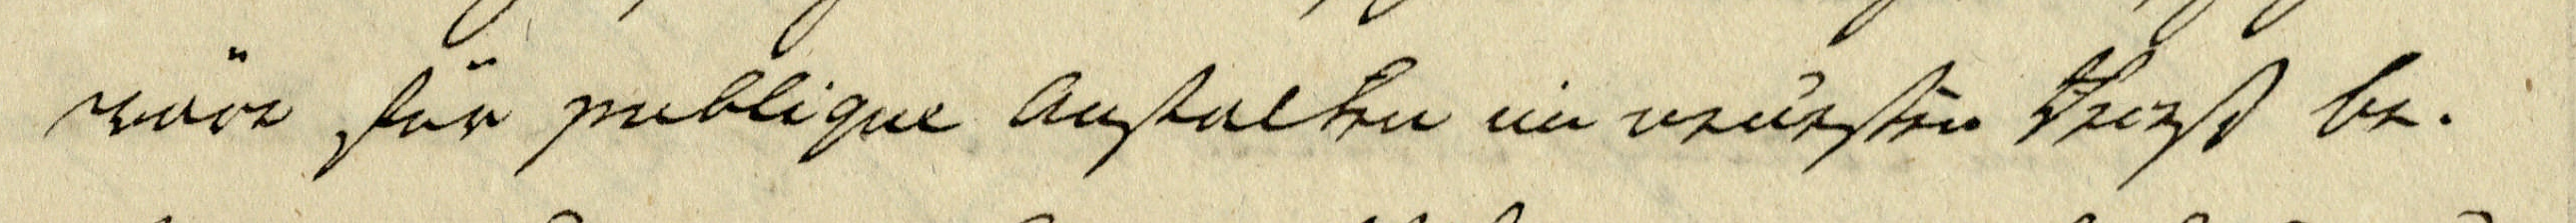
wäre für publique Anstalten im neuesten Receß be¬
